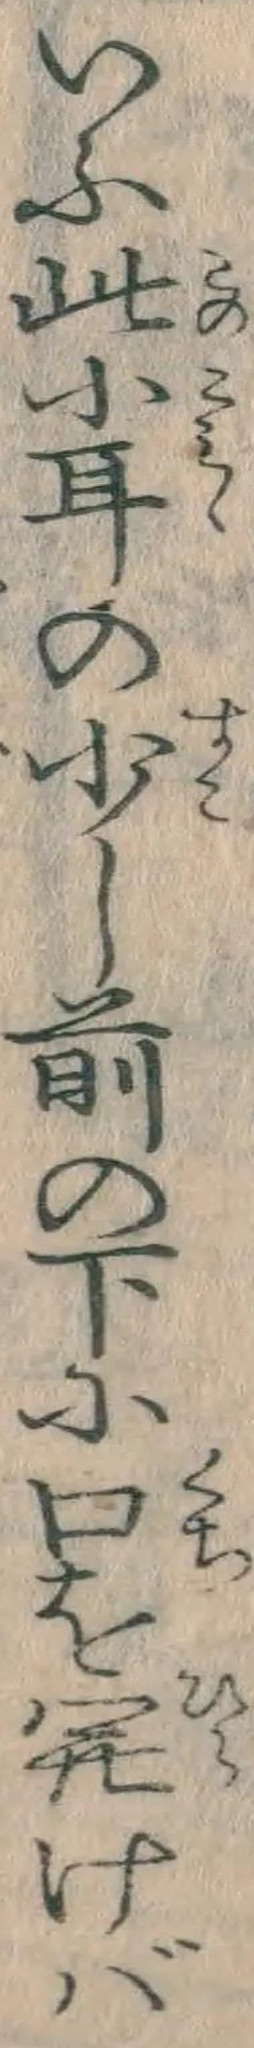いふ此小耳の少し前の下に口を開けば
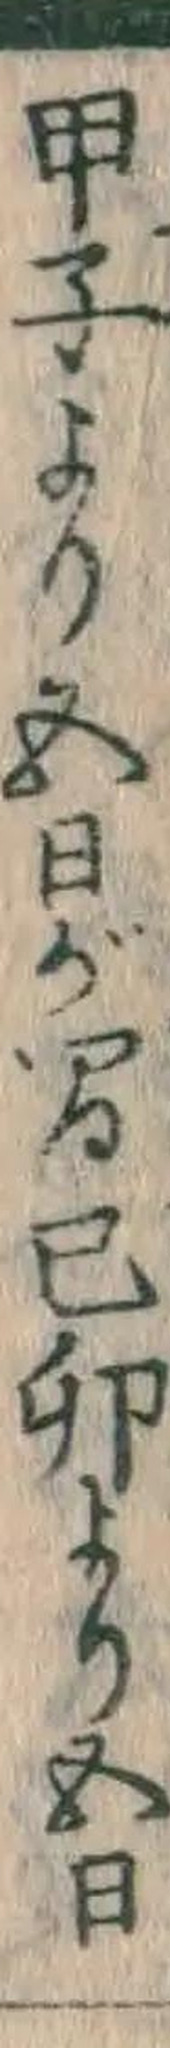甲子より五日が間己卯より五日
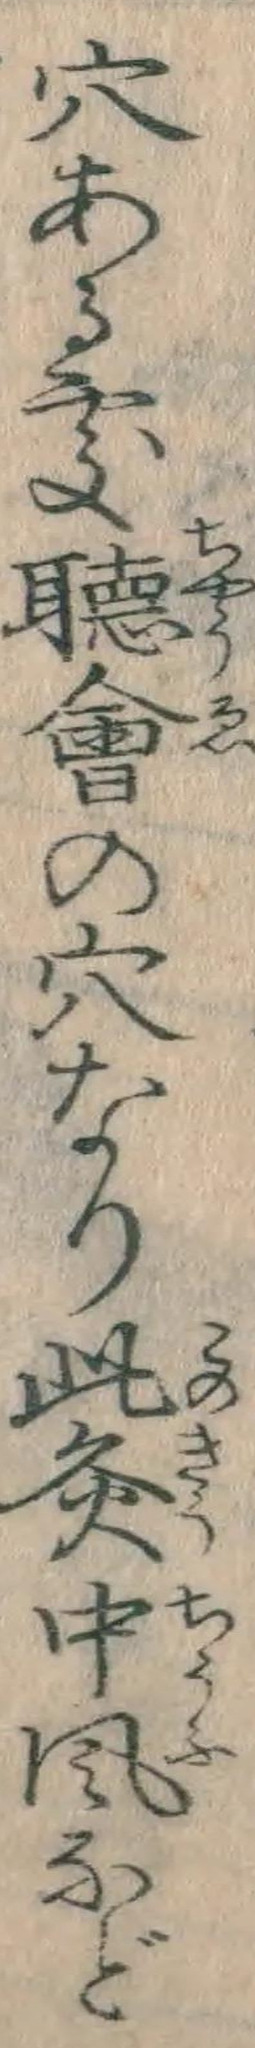穴ある処聴会の穴なり此灸中風など
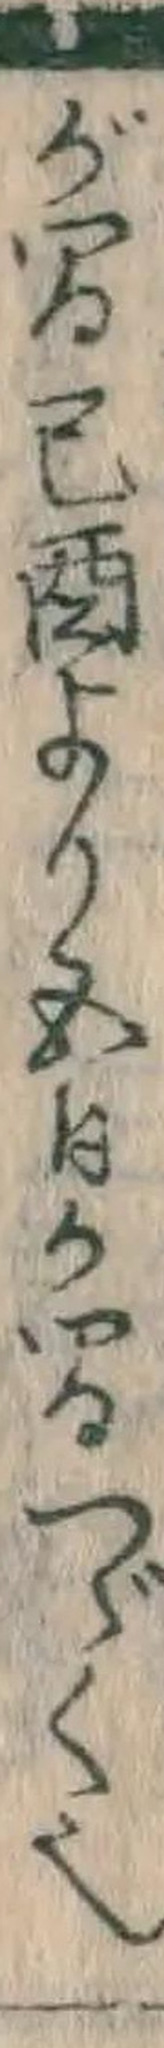が間己酉より五日か間つゞく也
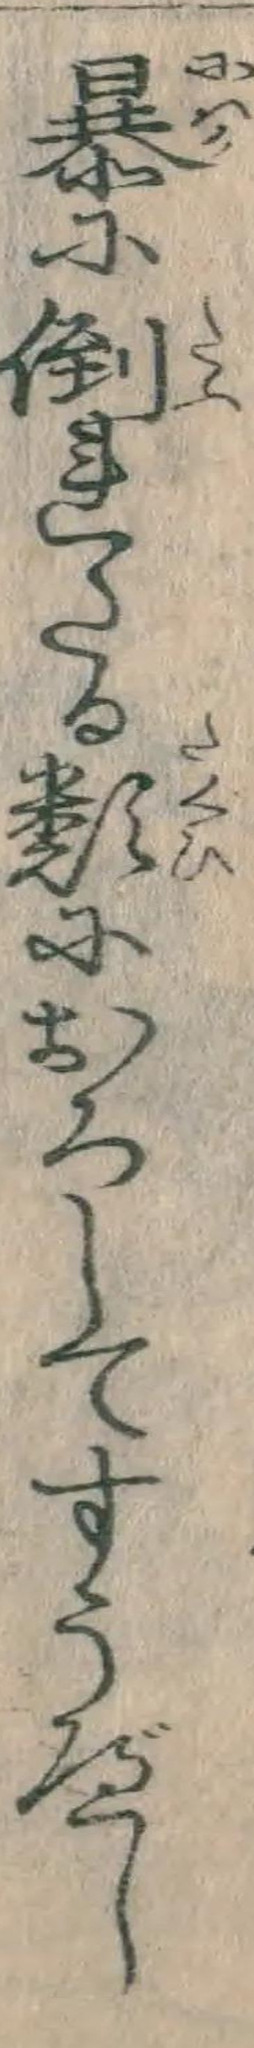暴に倒れたる類におろしてすうべし
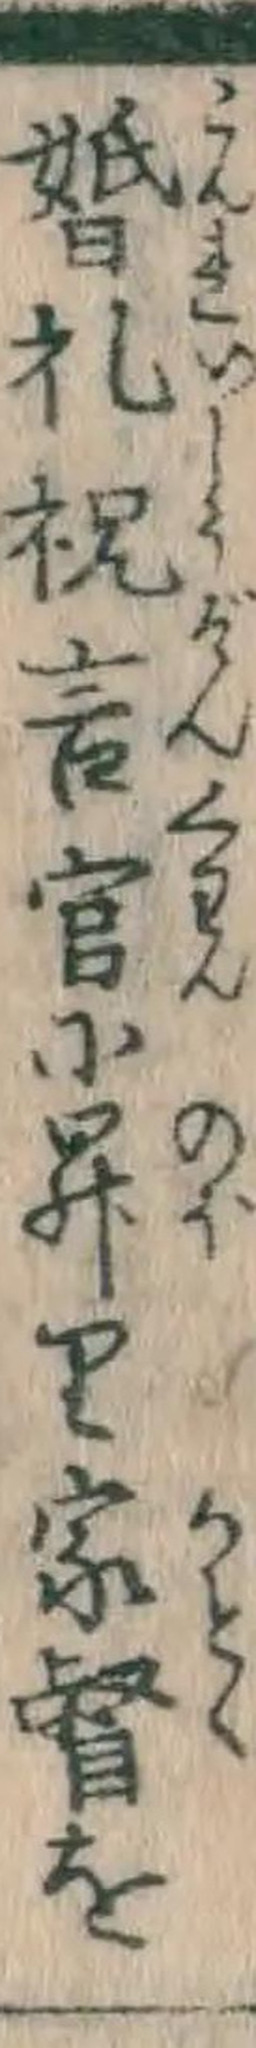婚礼祝言官に昇り家督を
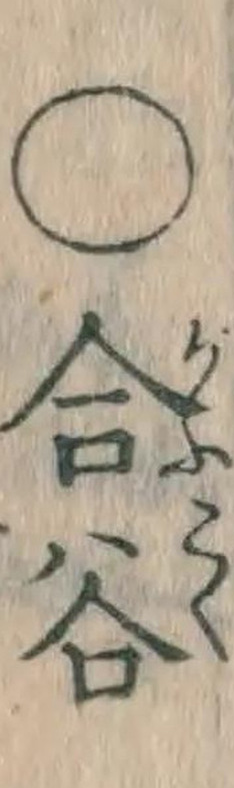○合谷
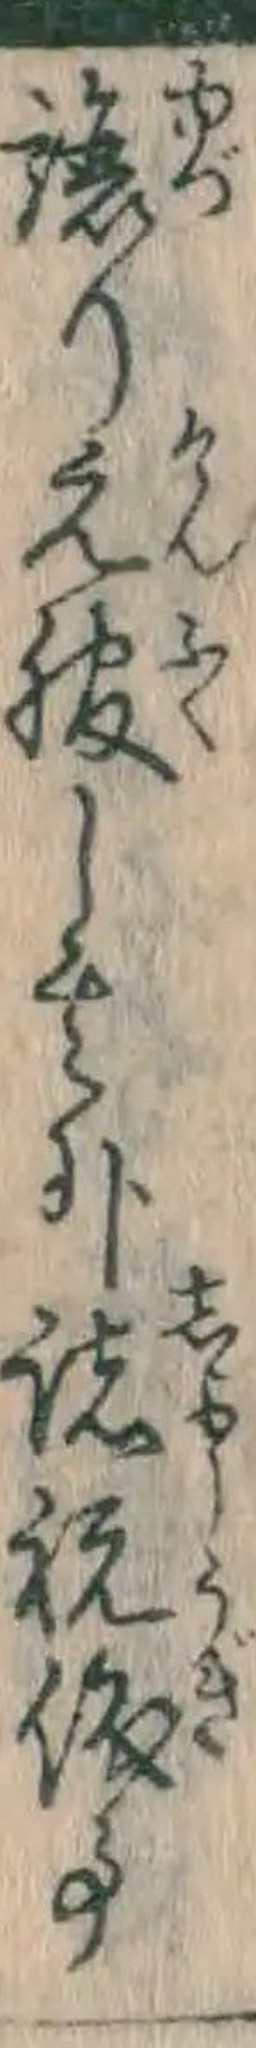譲り元服し其外諸祝儀事
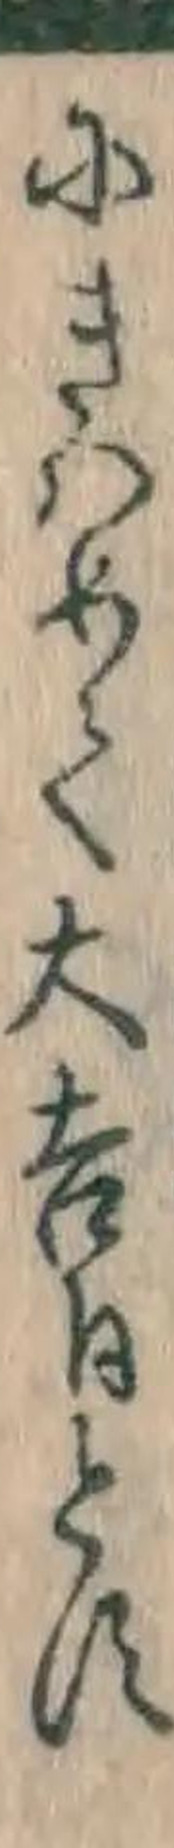にきはめて大吉日とす
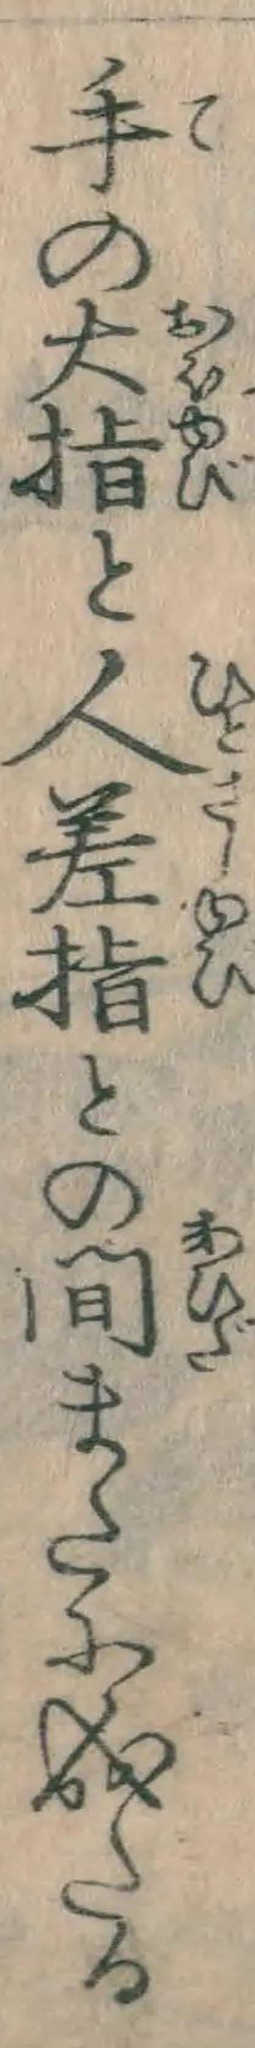手の大指と人差指との間またに成たる

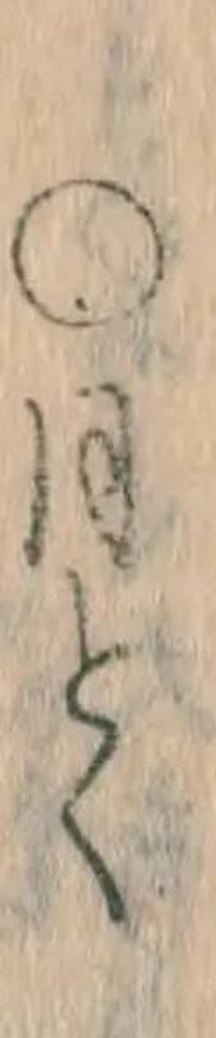○月とく
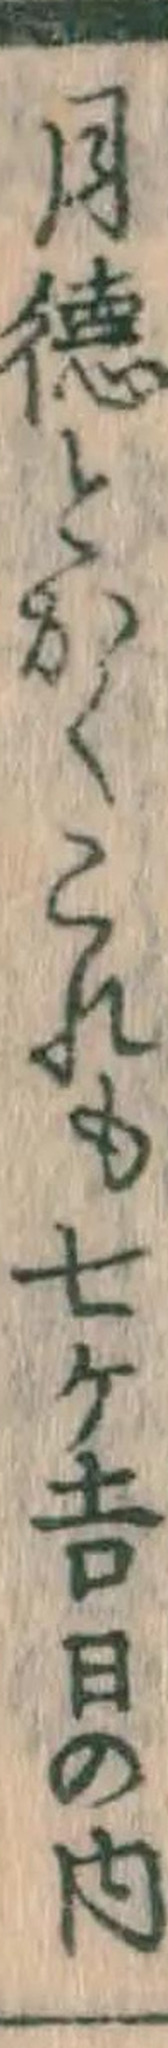月徳とかくこれも七ヶ吉日の内
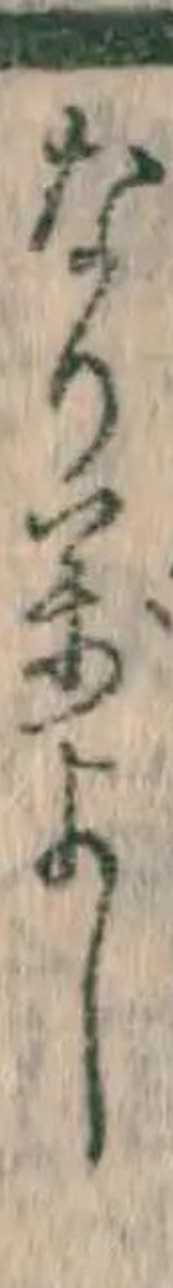なり万よし
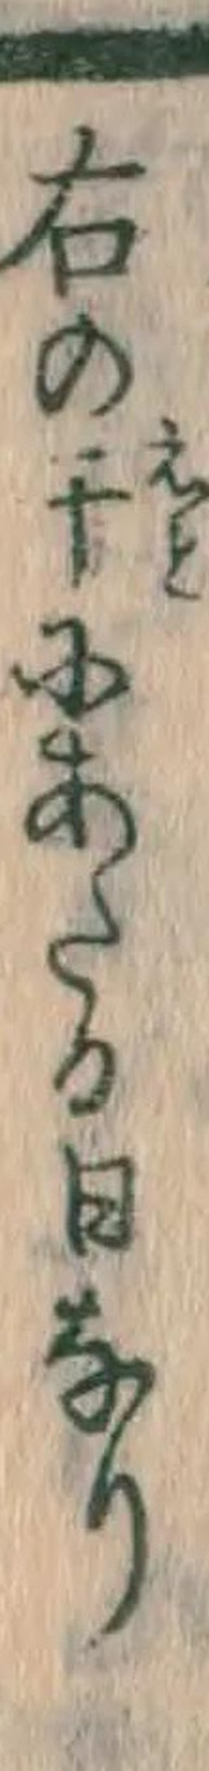右の干にあたる日なり
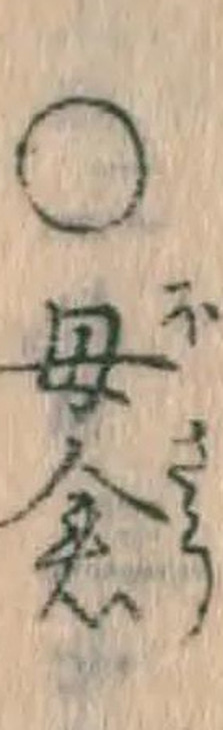○母倉
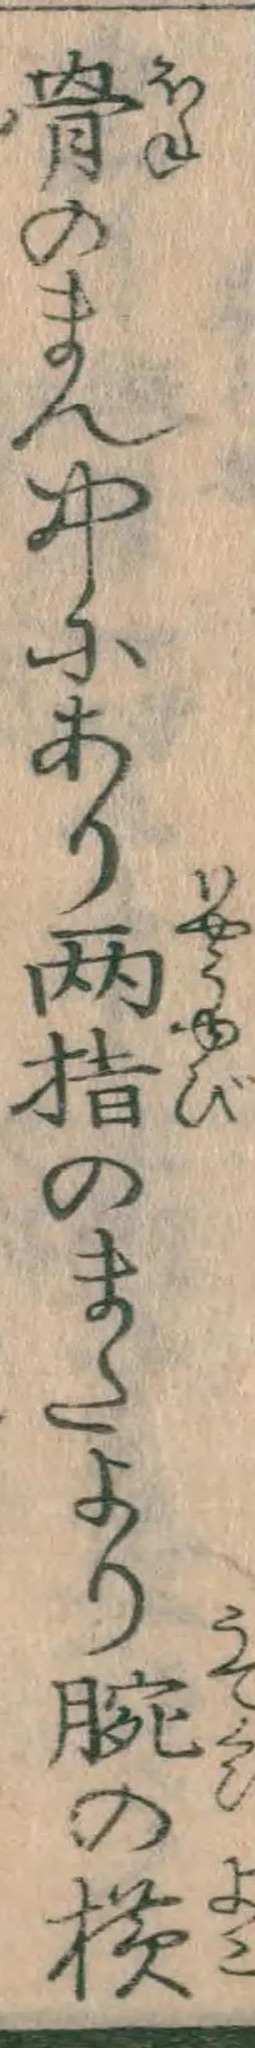骨のまん中にあり両指のまたより腕の横
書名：広益秘事大全 3巻. [4]
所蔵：国立国会図書館 National Diet Library, JAPAN
